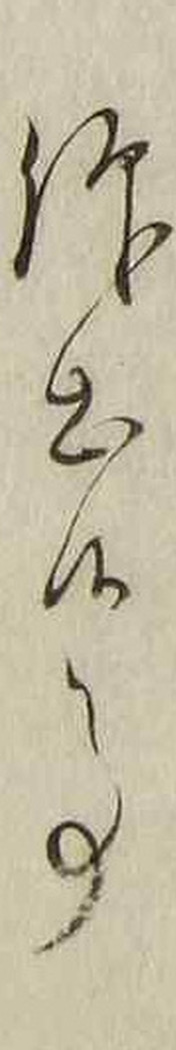仰付候事

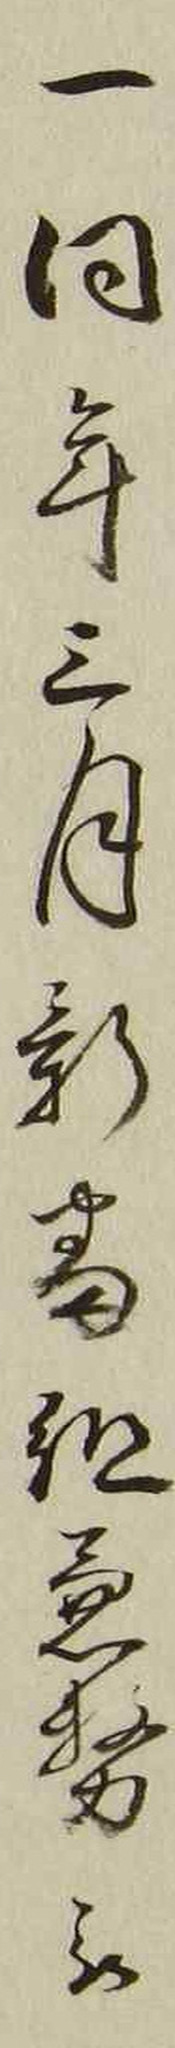一同年三月新番組兼務被
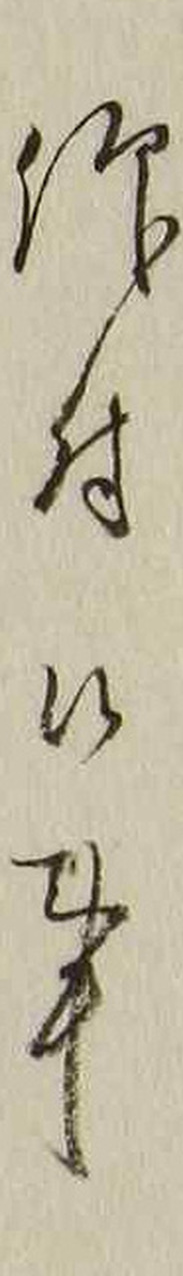仰付候事
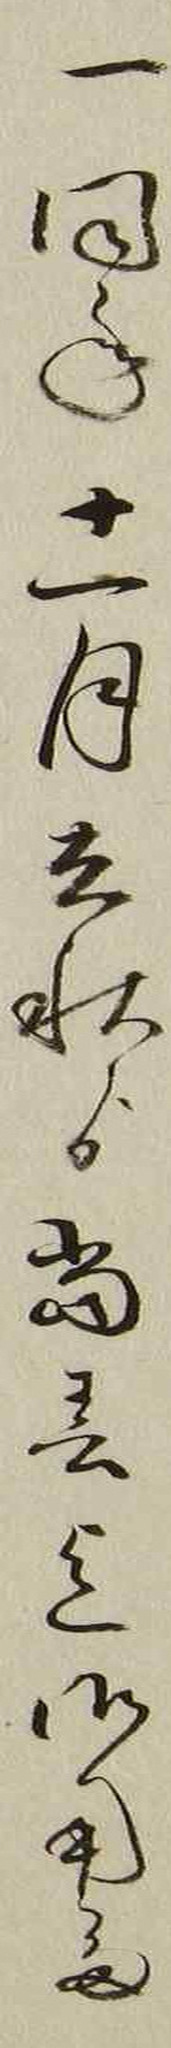一同年十一月去秋ゟ当春迄御用多
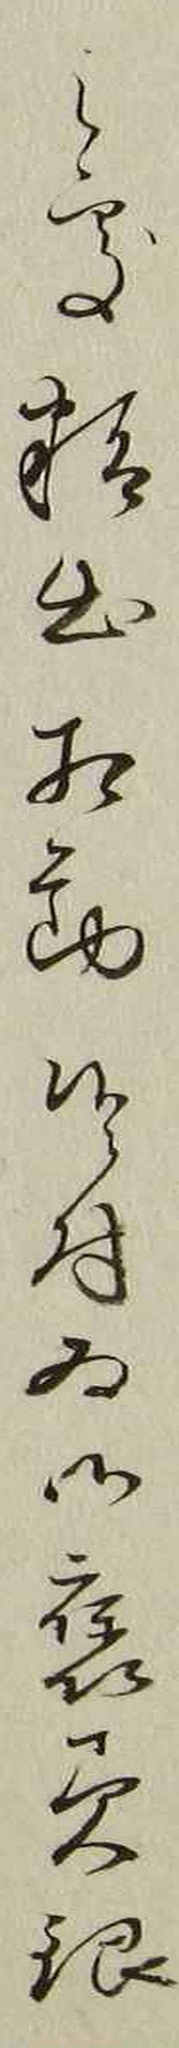之処精出相勤候ニ付為御褒美銀
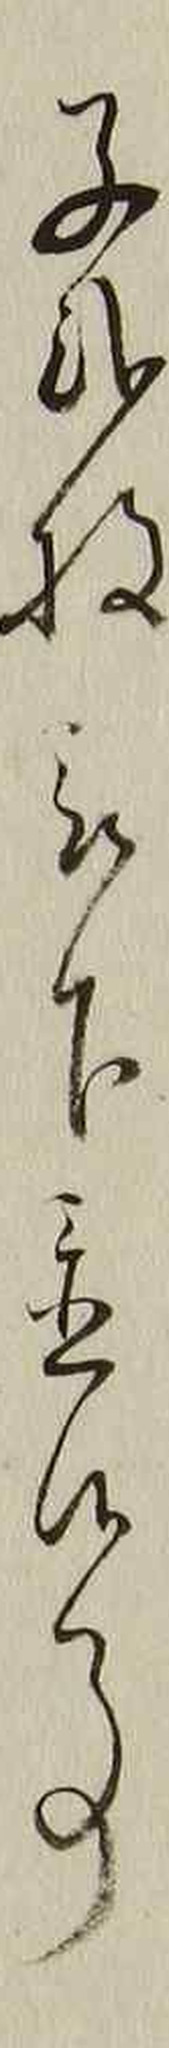子弐枚被下置候事
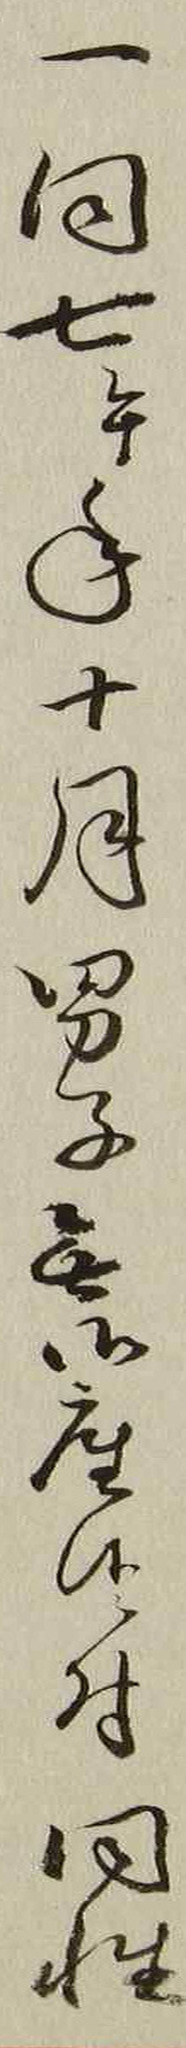一同七午年十月男子無御座候ニ付同性
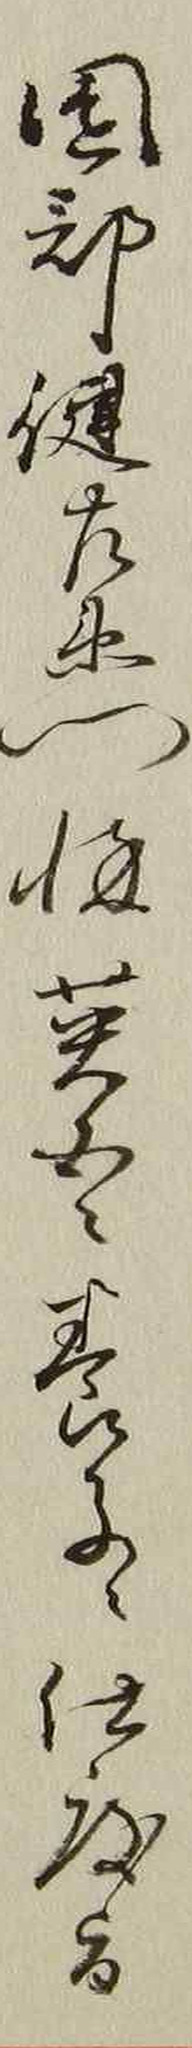園部健左衛門忰英吾養子ニ仕度旨
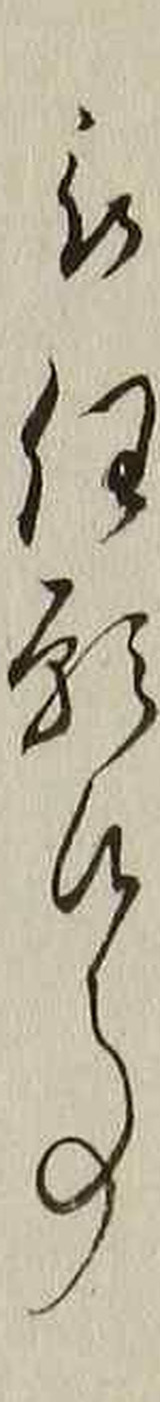被任願候事
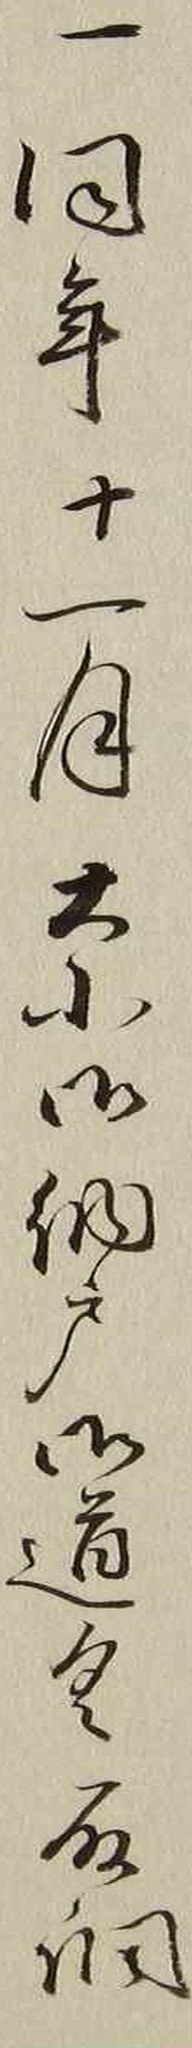一同年十一月大小御納戸御道具取調
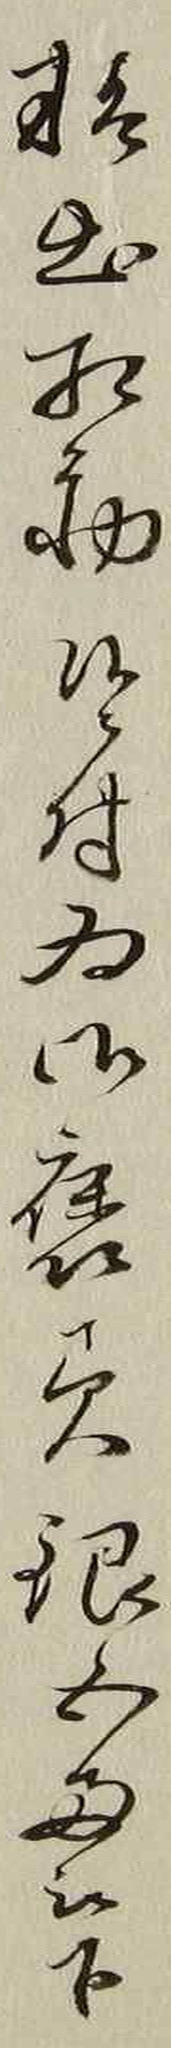精出相勤候ニ付為御褒美銀五両被下
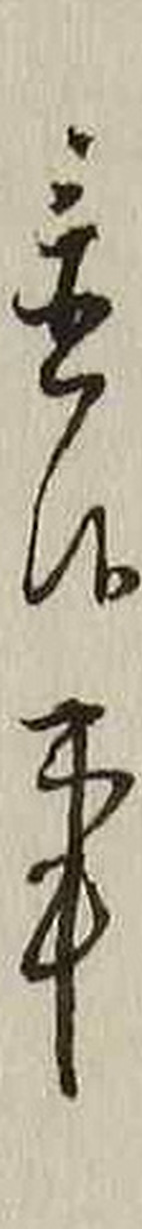置候事
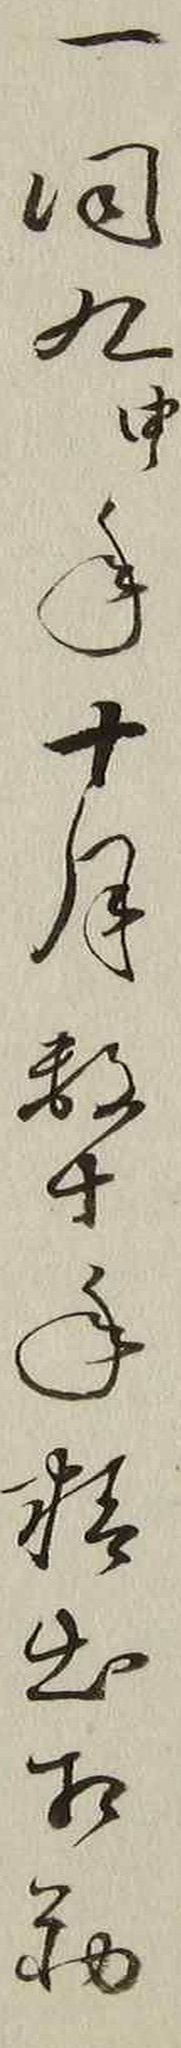一同九申年十月数十年精出相勤
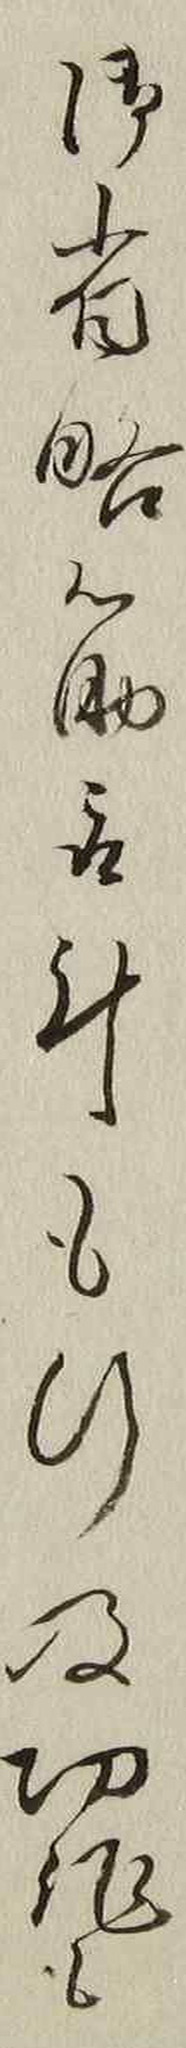御省略筋取計も行及功作も
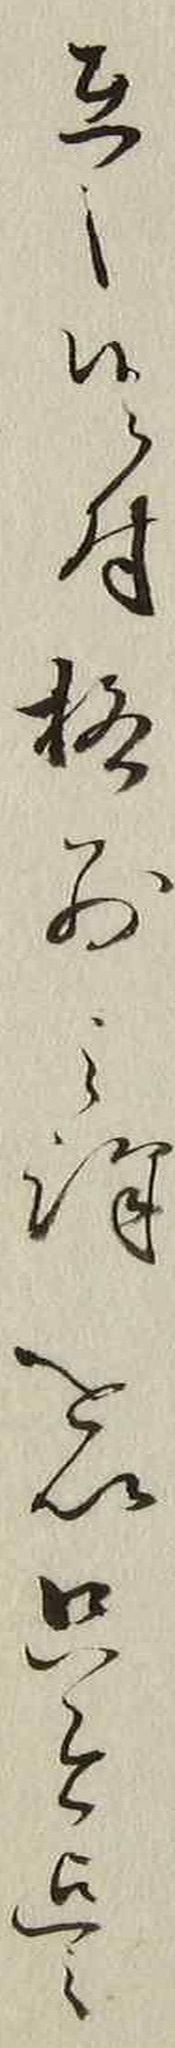在之候ニ付格別之訳を以只今迄之
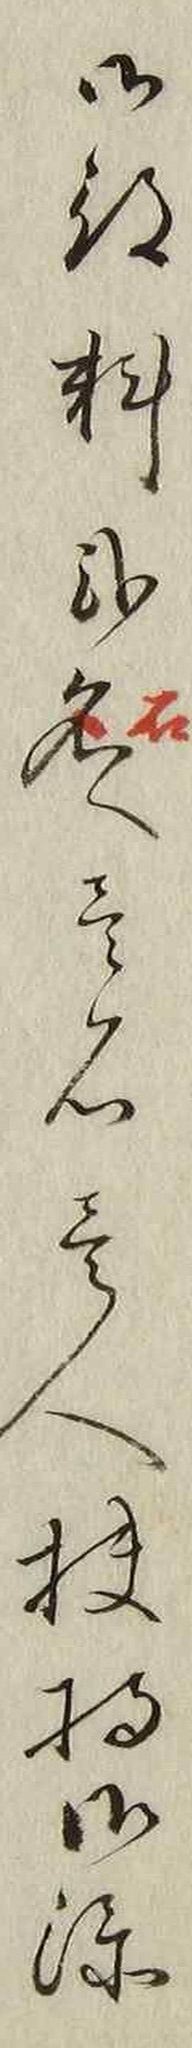御役料弐石へ壱石壱人扶持御添
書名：諸士系譜　巻之4　い之部4
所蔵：会津若松市立会津図書館
